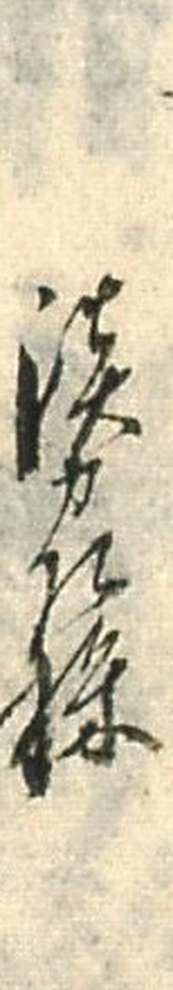淡州株
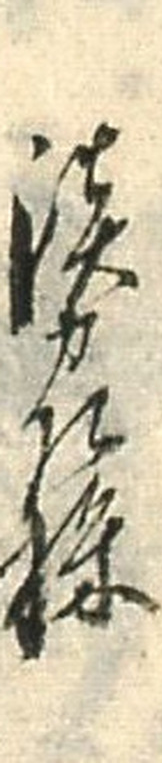淡州株
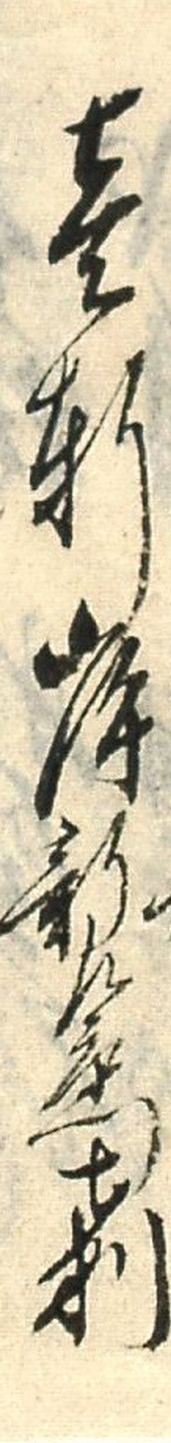壱軒岸新左衛門才判
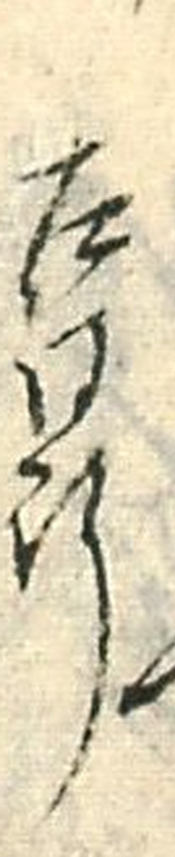右同断
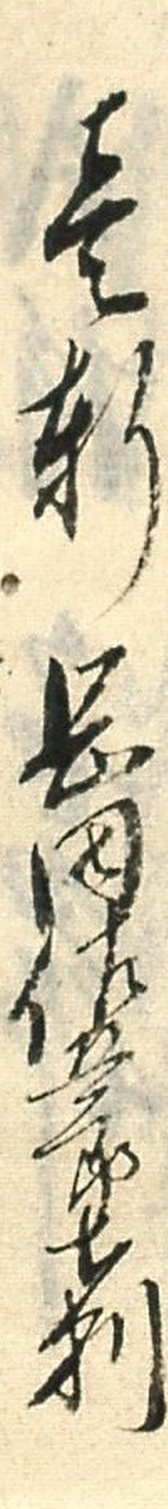壱軒岡田佐五郎才判
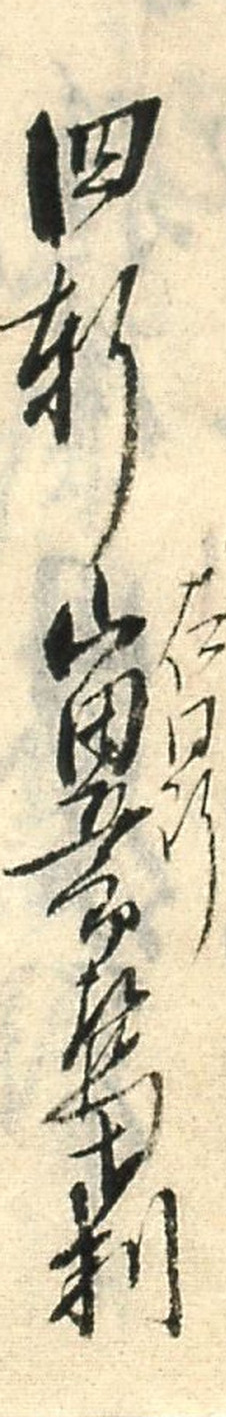四軒山田五郎左衛門才判
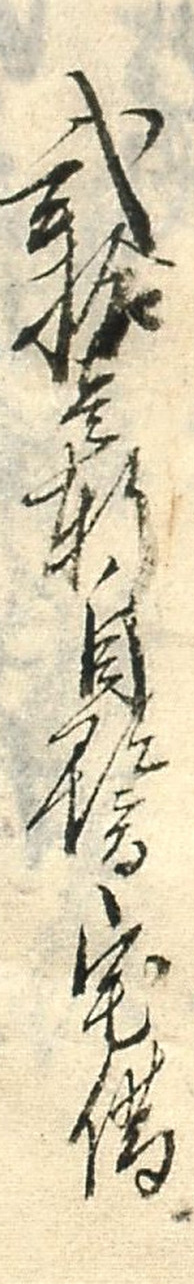弐拾壱軒自郡に而宅借
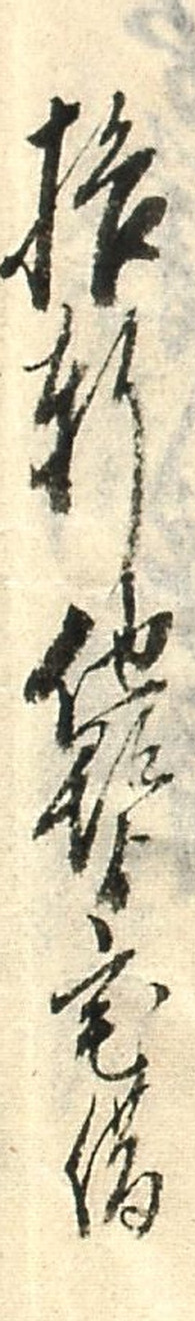拾軒他郡ゟ宅借
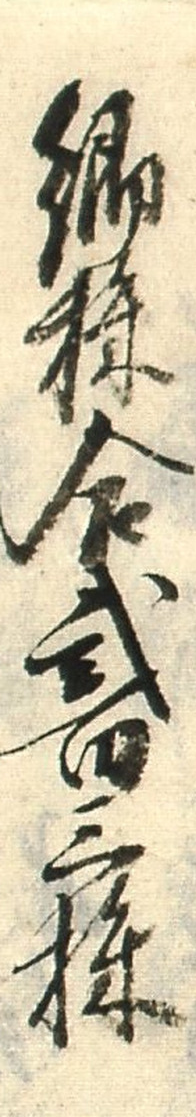端株合弐百三株
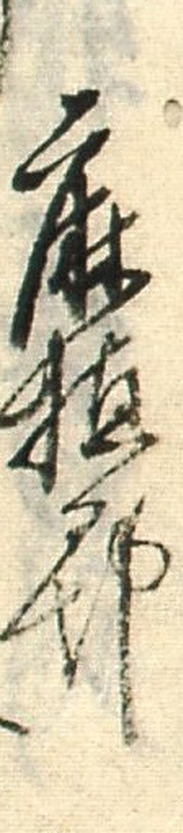麻植郡
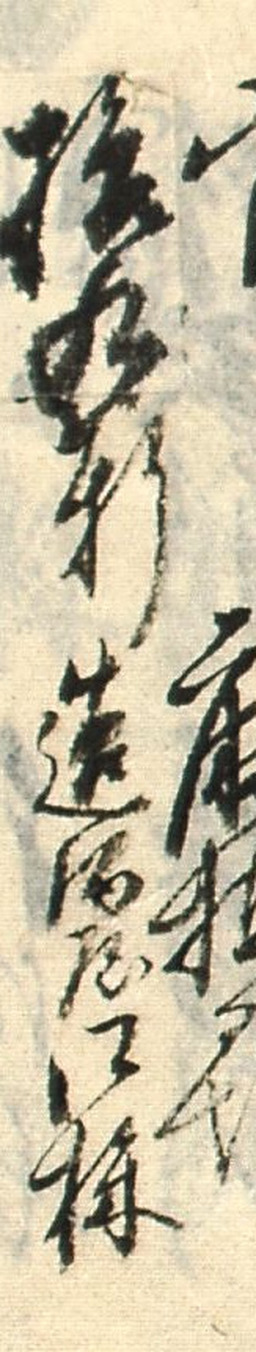拾九軒造酒屋四株
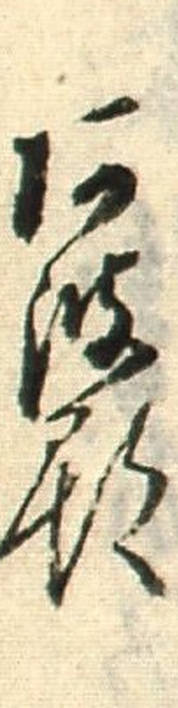阿波郡
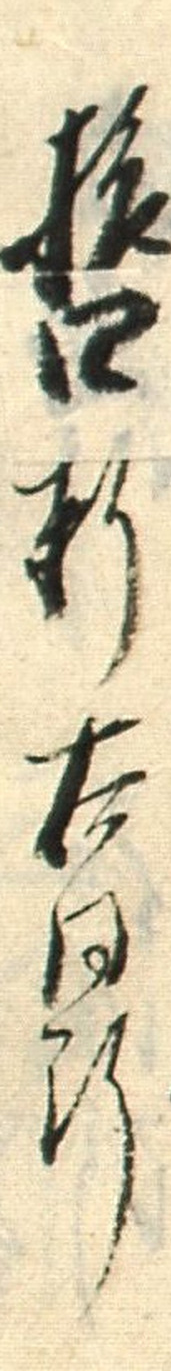拾四株右同断
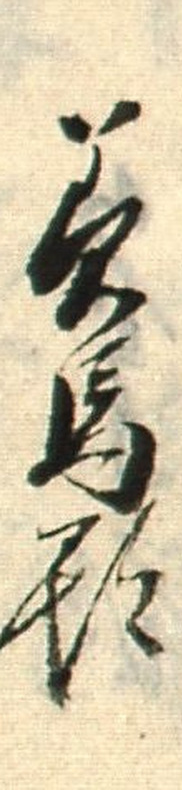美馬郡
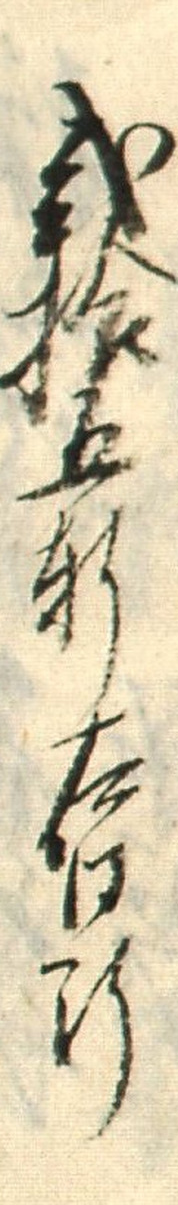弐拾五軒右同断
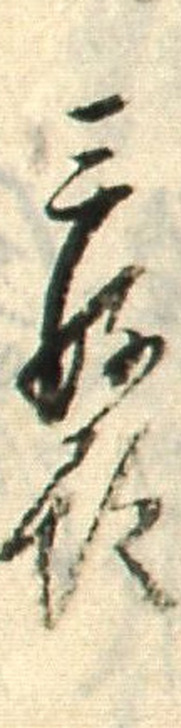三好郡
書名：南北拾郡造酒屋数並株数調子帳
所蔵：鳴門教育大学 Naruto University of Education
